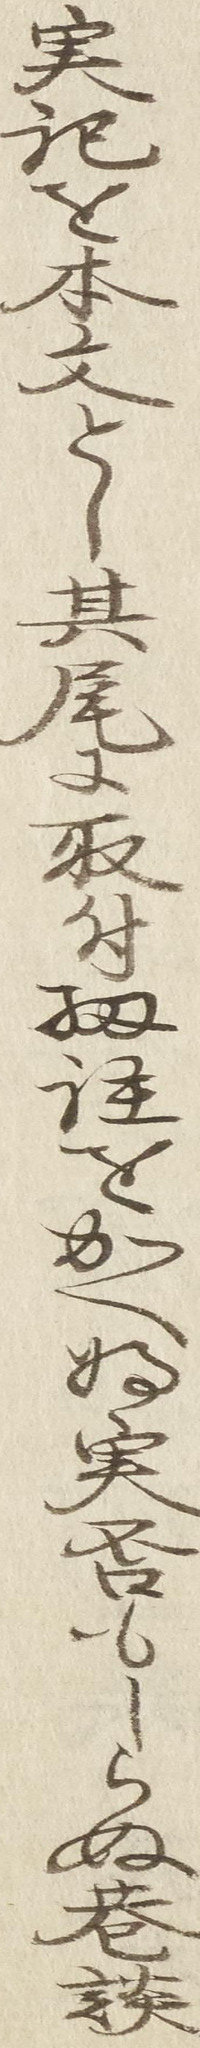実記を本文とし其尾に取付扨註を加へ為実否もしらぬ巷談
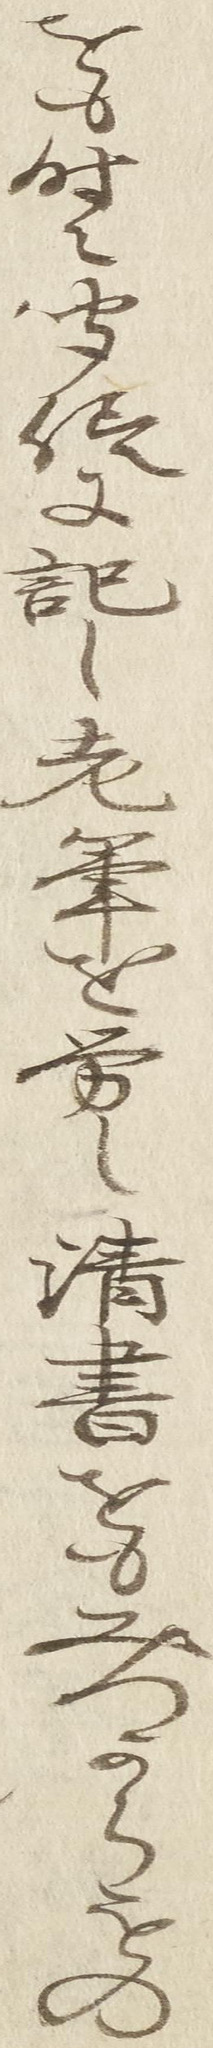をも時々聞侭に記し老筆を労し清書をもみつからもの
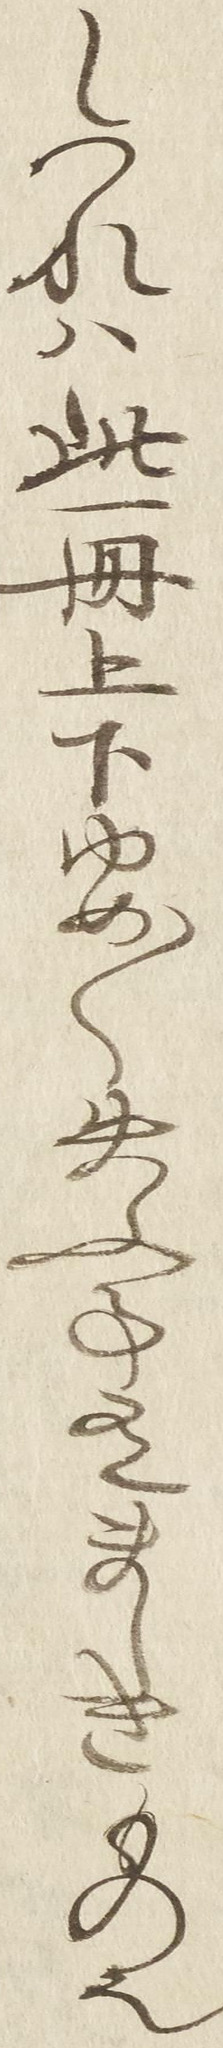しつれは此一冊上下ゆめ〳〵失ふ事有ましきもの也
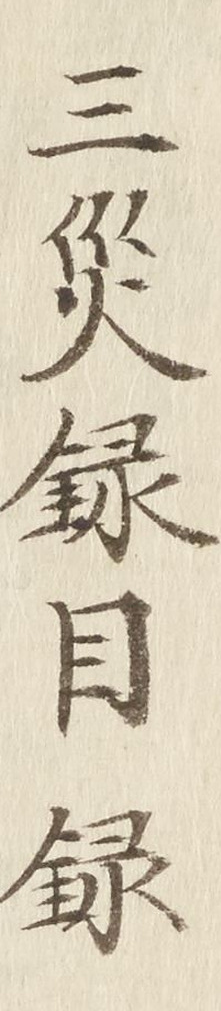三災録目録
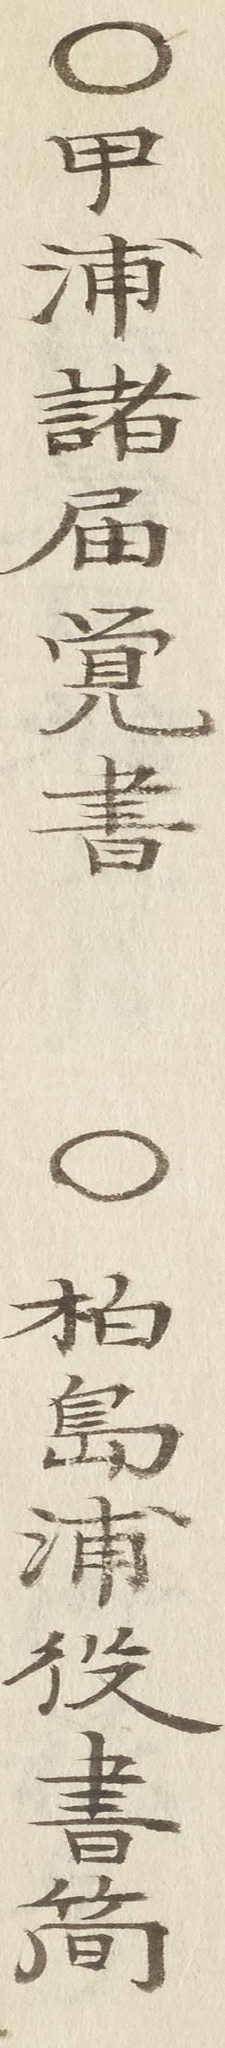〇甲浦諸届覚書〇粕島浦役書簡
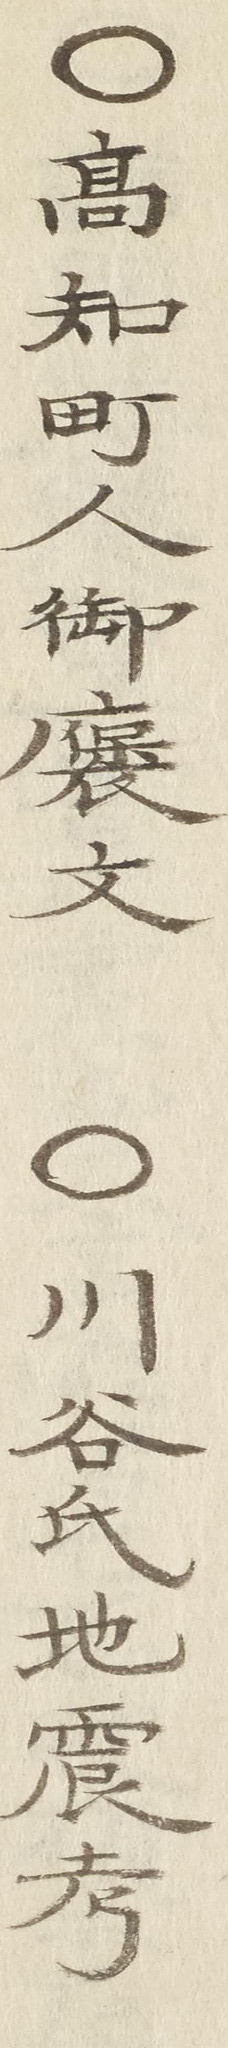〇高知町人御褒文〇川谷氏地震考
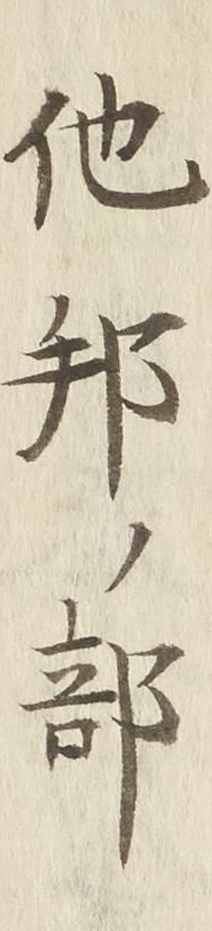他邦ノ部

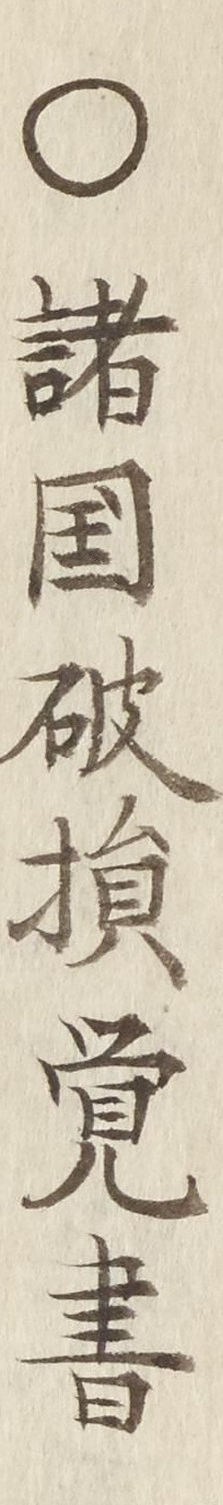〇諸国破損覚書
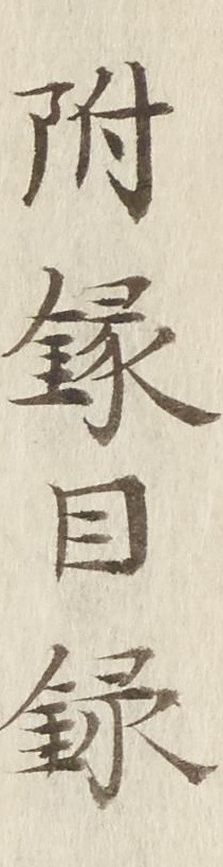附録目録
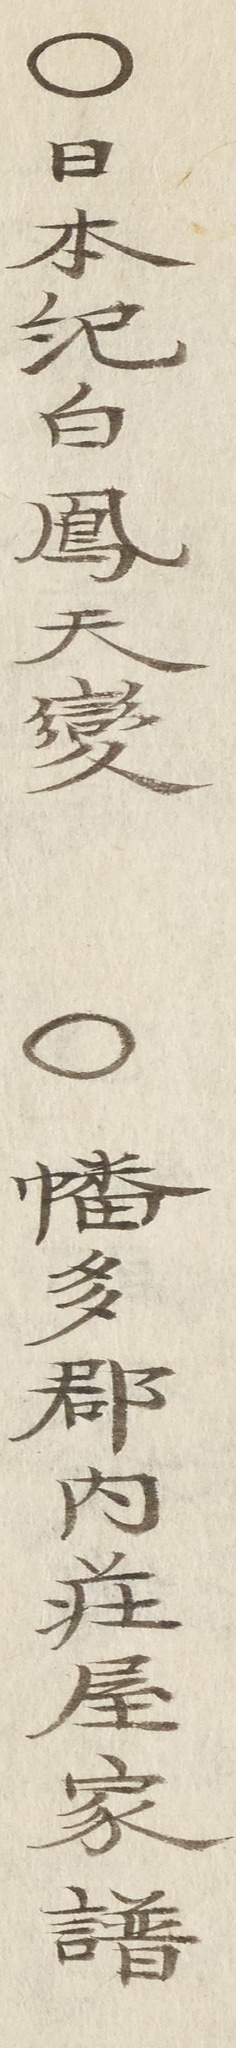〇日本紀白鳳天変〇幡多郡内庄屋家譜
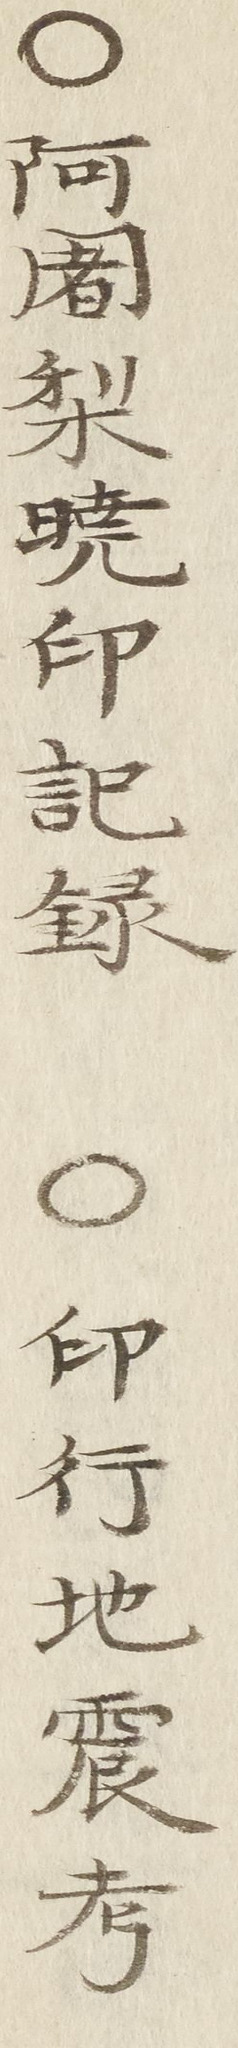〇阿闍梨暁印記録〇印行地震考
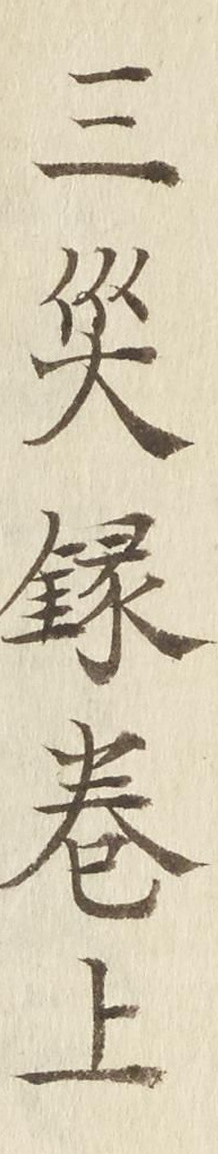三災録巻上
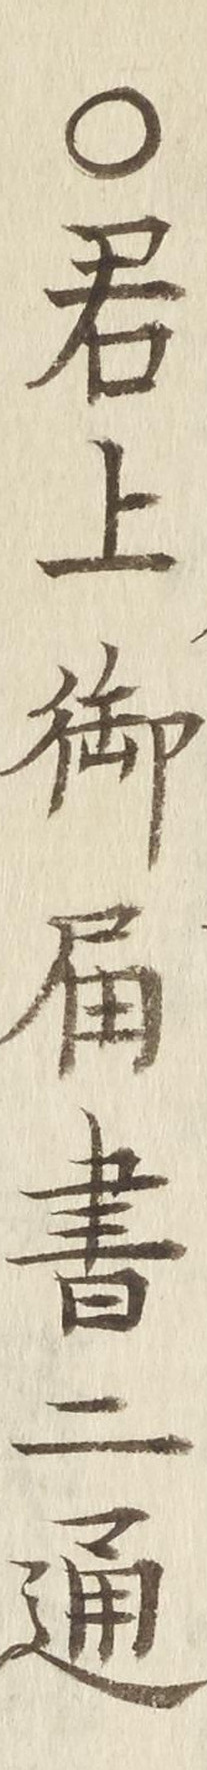〇君上御届書二通
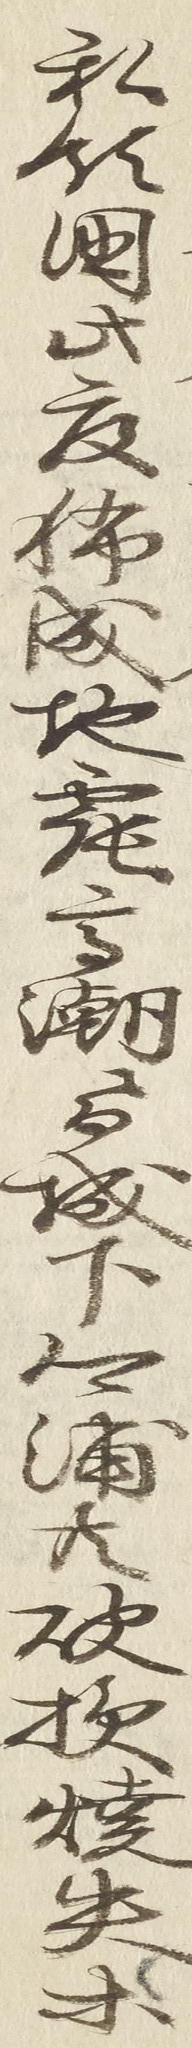私領国此度稀成地震高潮にて城下郷浦共破損焼失等
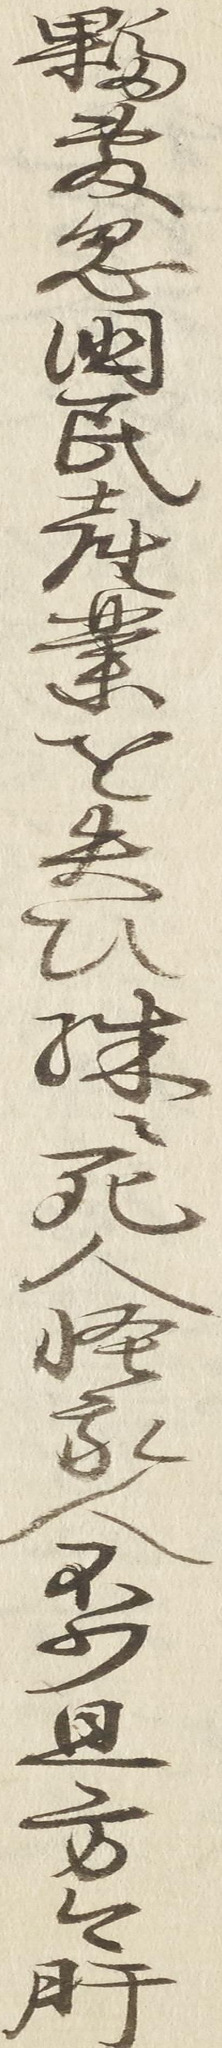夥敷忽国民産業を失ひ殊に死人怪我人不少且方今肝
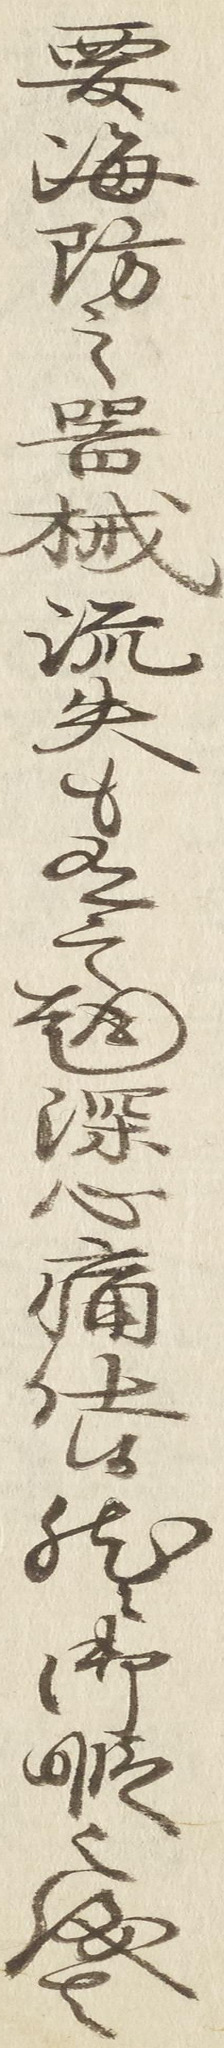要海防之器械流失も有之趣深心痛仕候然に御暇之儀は
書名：地震記　上
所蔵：東京大学地震研究所図書室 Earthquake Research Institute Library, The University of Tokyo, JAPAN
